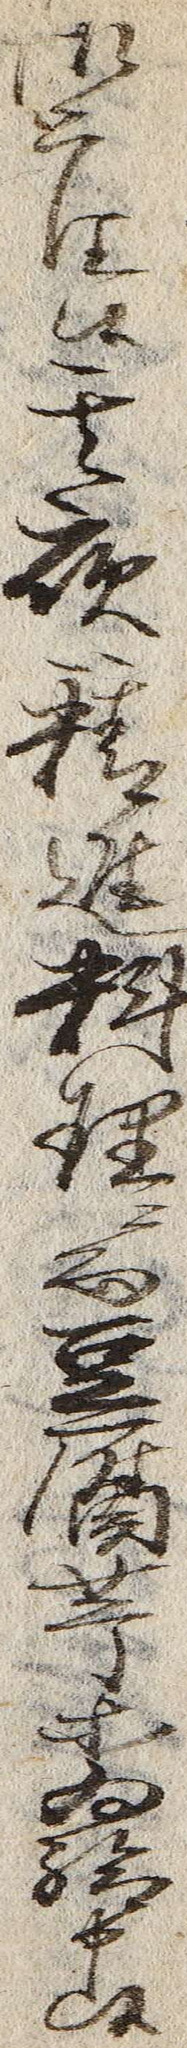御座候其夜は精進料理にて豆腐芋等為給申候
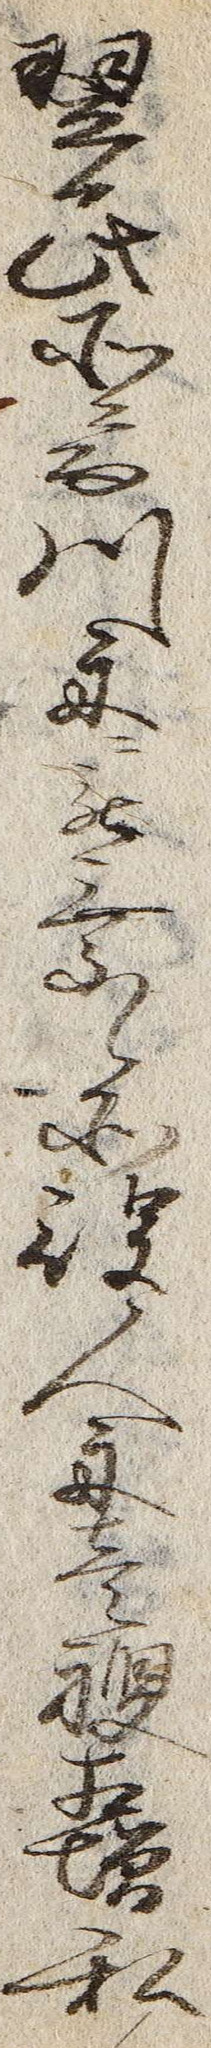翌日此所にて川舟に被乗候所役人舟一艘相増私
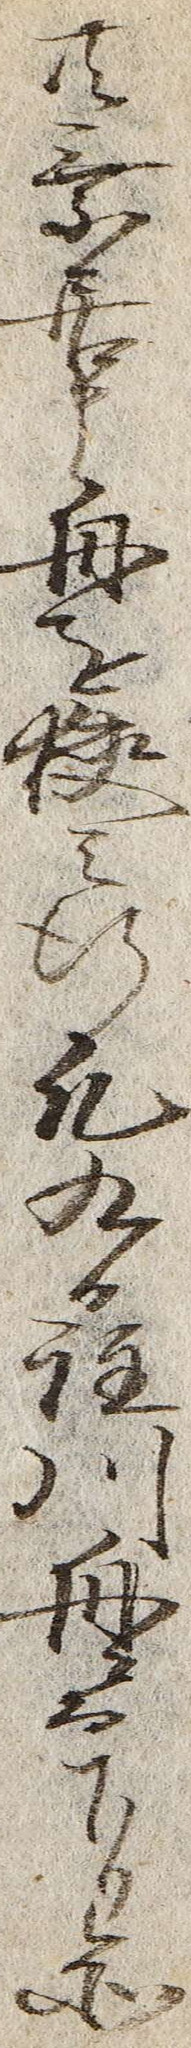ども乗居申候舟を挟み行凡九日程川舟にて下り候所
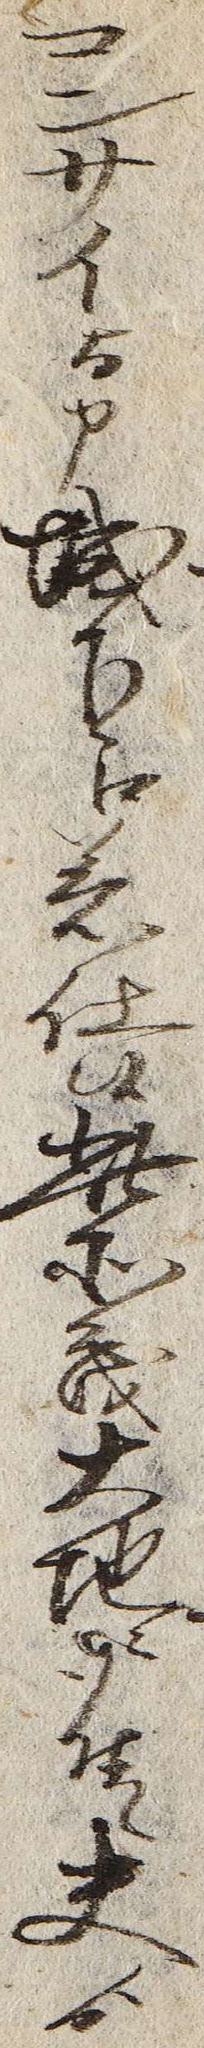コンサイと申城下へ着仕候此所も大地に御座候夫より
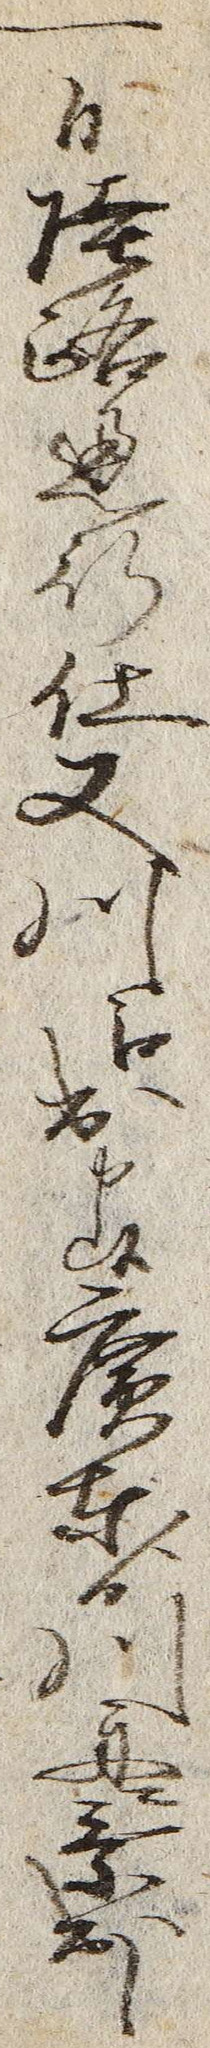一日陸路通行仕又川へ出申候広東より川船に乗出し
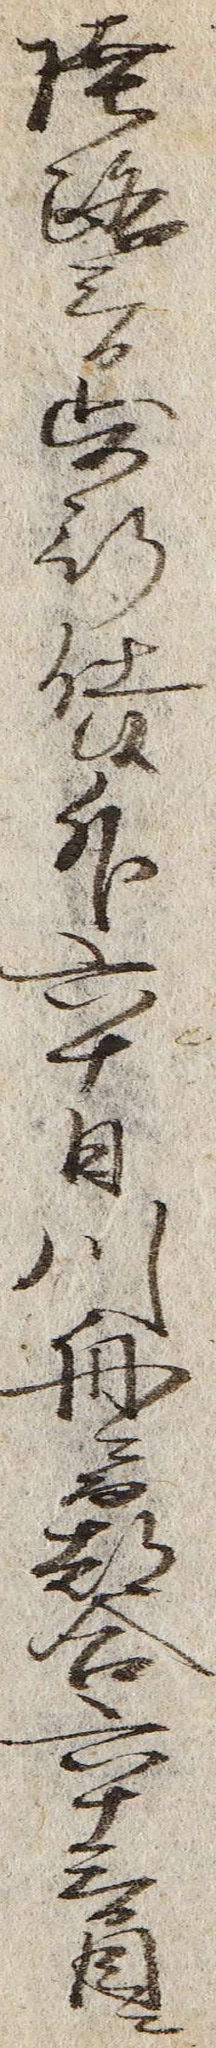陸路三日歩行仕候外六十日川舟にて都合六十三日目に
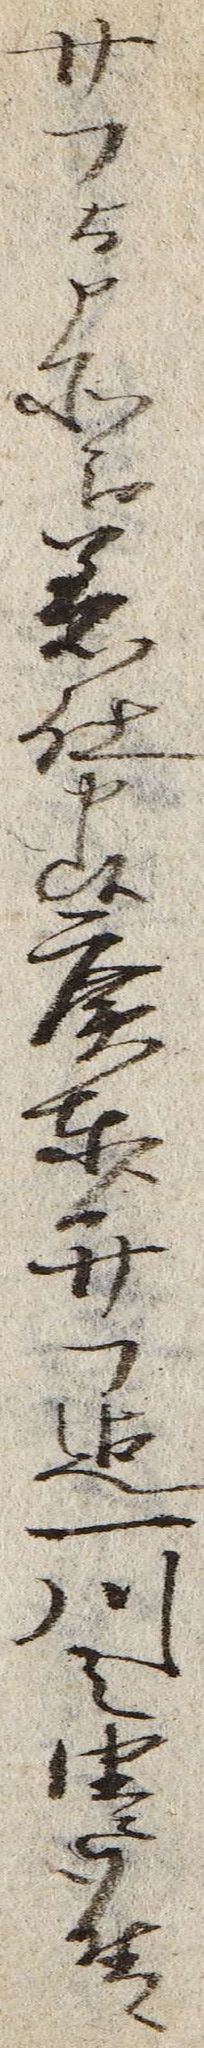サフと申所へ着仕申候広東よりサフまで一川の由に御座候
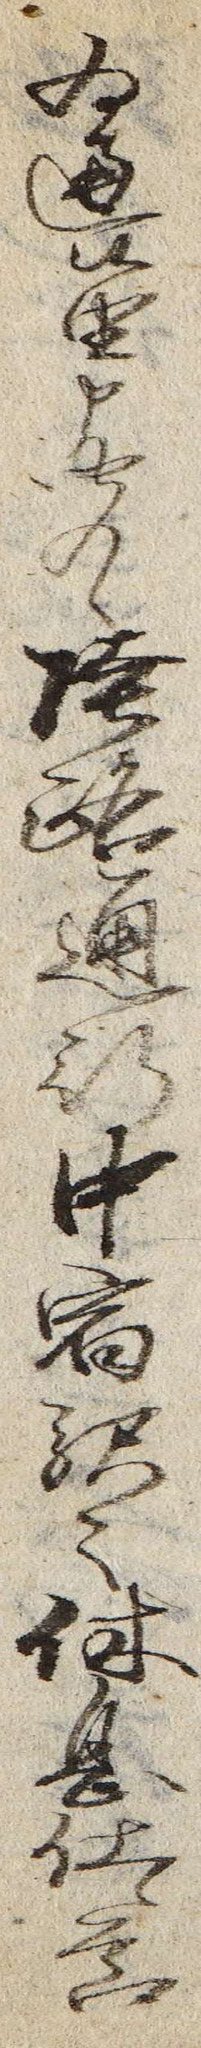為通候由申聞候陸路通行中宿駅に休息仕候節

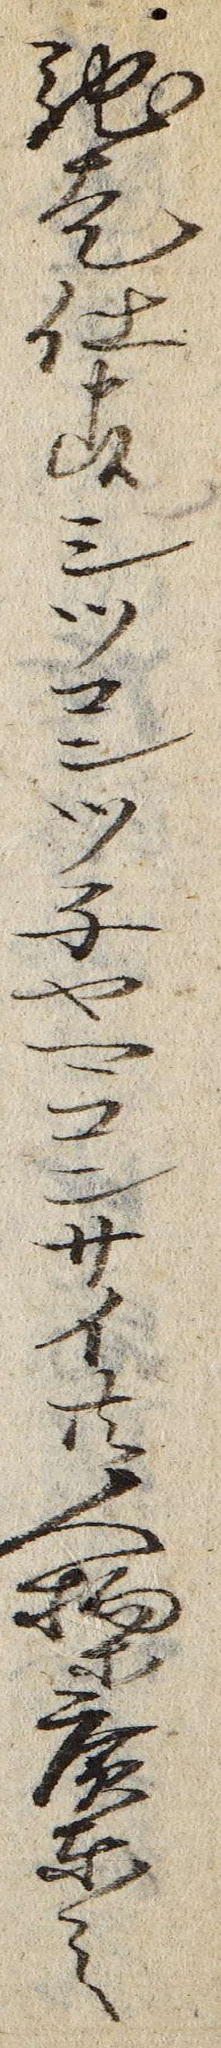馳走仕申候シツマンツネヤマコンサイとも人物等広東の
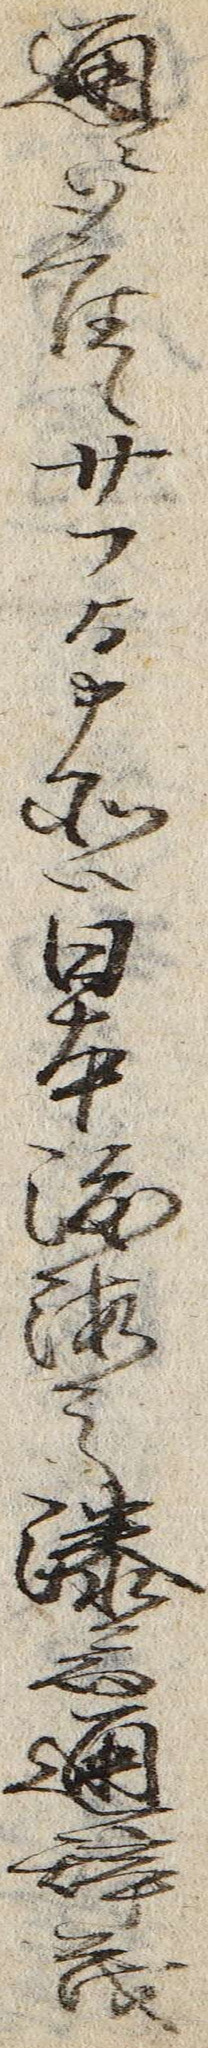通に御座候サフと申所は日本渡海の湊にて通辞も
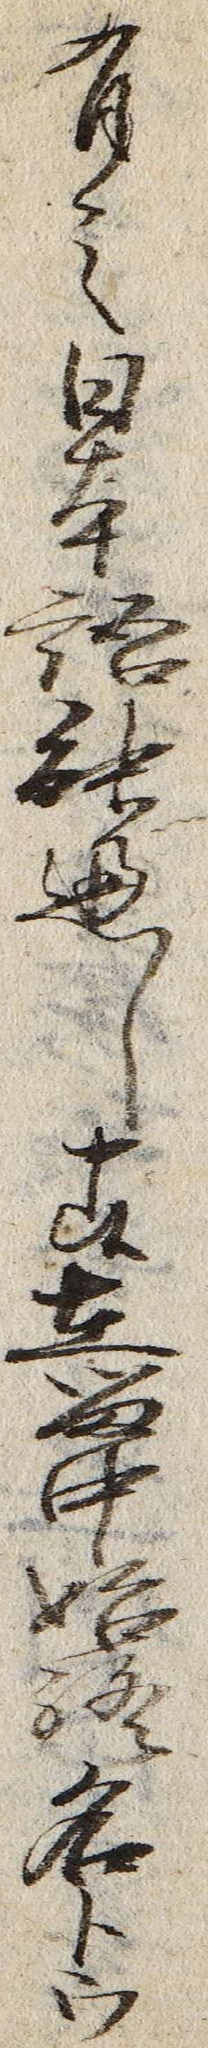有之日本語能通し申候在留中始終名トウ
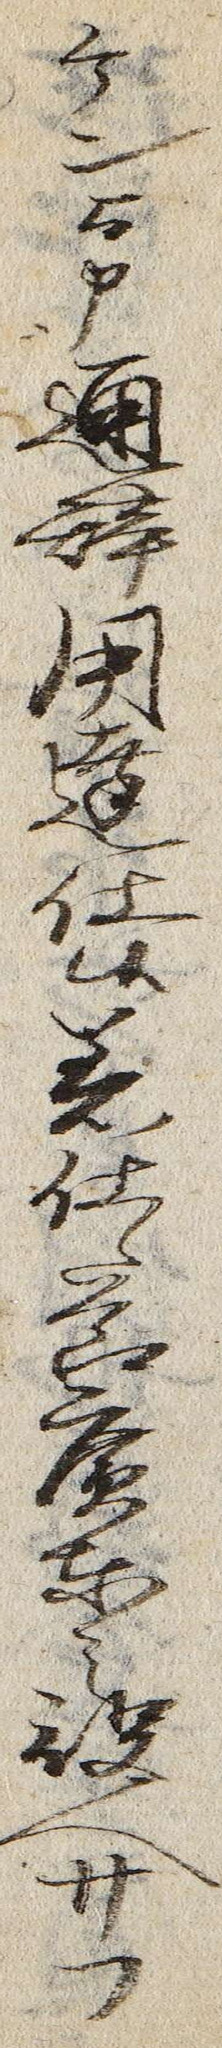ケンと申通辞用達仕候着仕候節広東の役人サフ
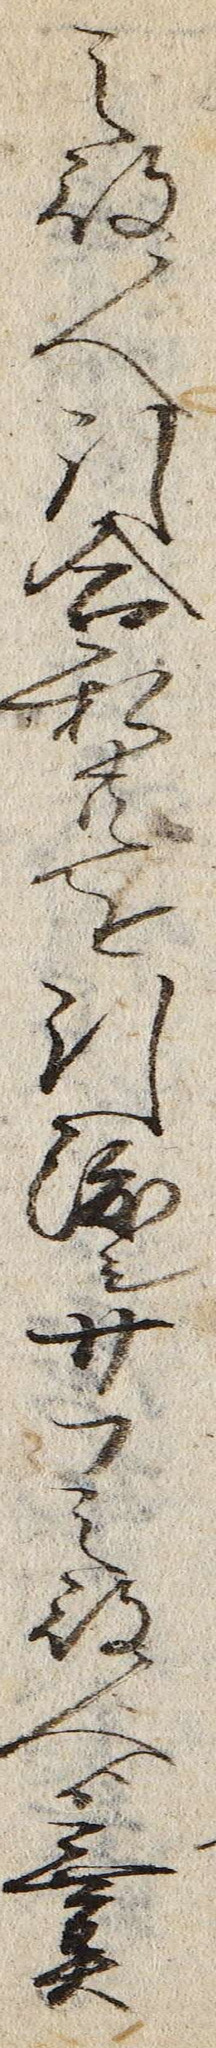の役人引合私どもを引渡しサフの役人より無異
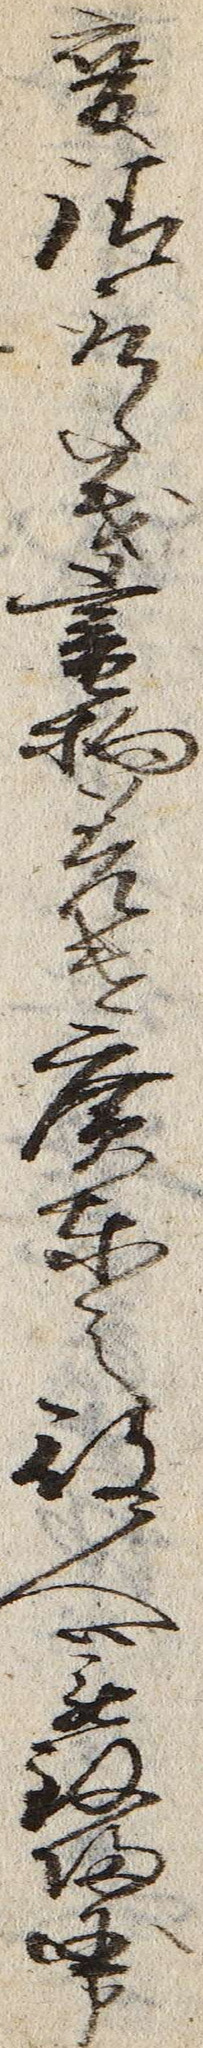変受取候義書物差遣広東の役人は被致帰国申
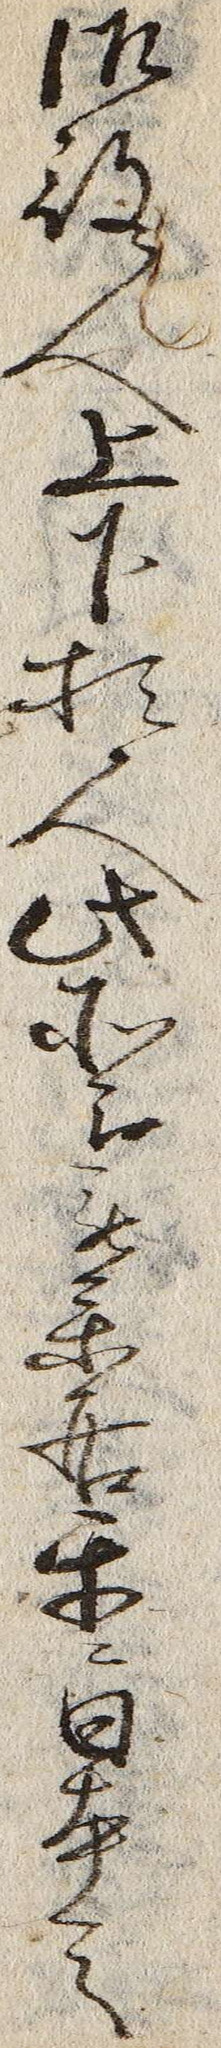御役人上下十人此所へ被参居互に日本の
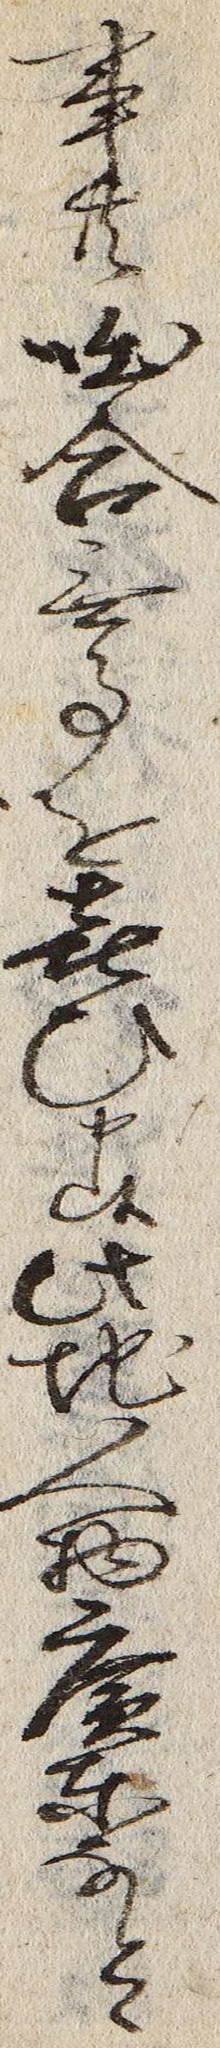事ども話合無事を喜ひ申候此地人物広東なとゝ
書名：能登国清兵衛異国江漂流之始末
